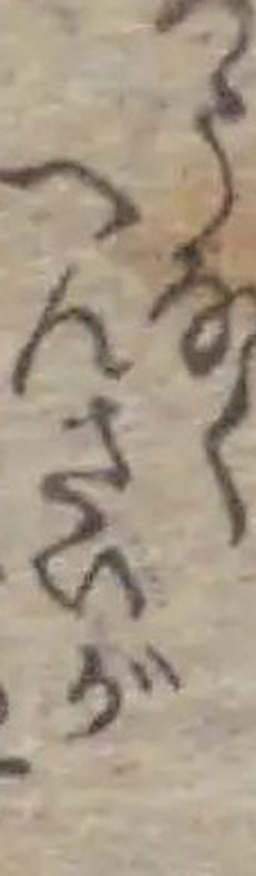へんさいが
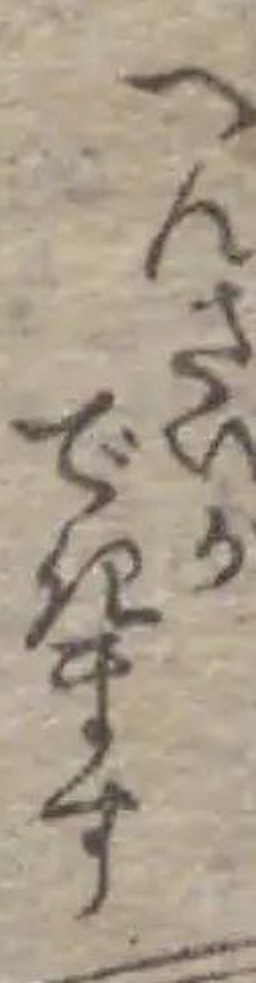できます
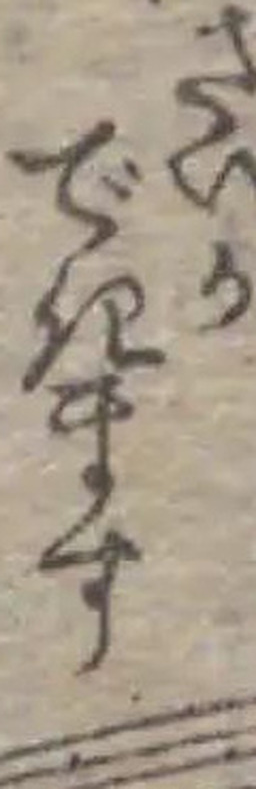できます
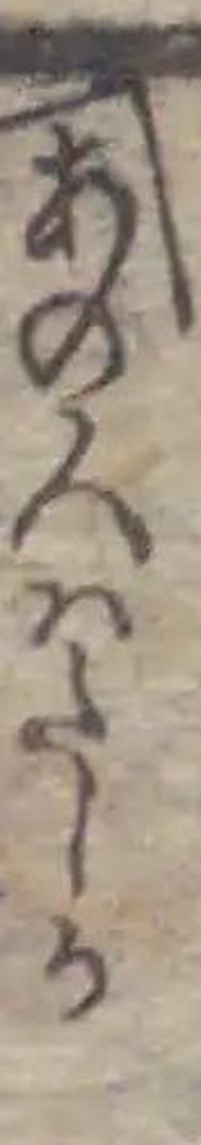〽あの人はたしか
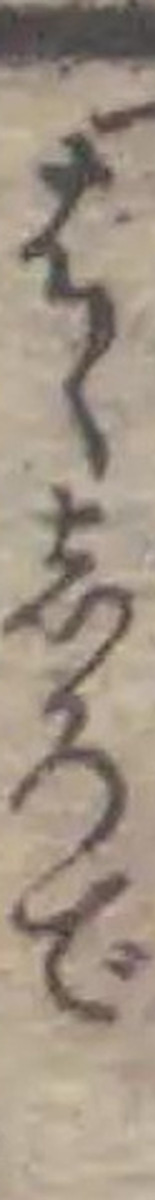はくしろで

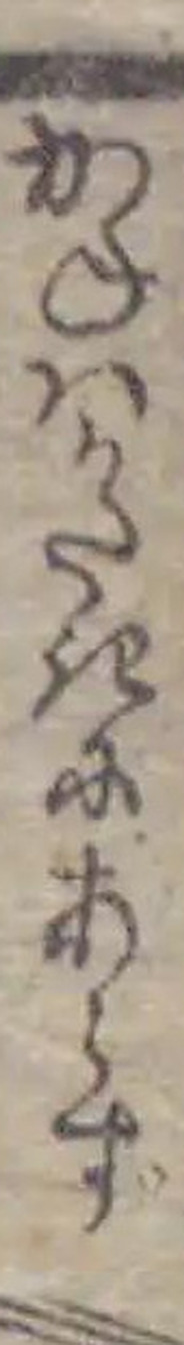かねはかたきにあらず
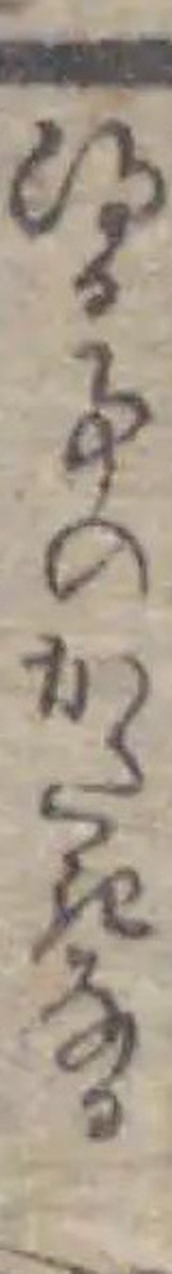得る事のかたきなる
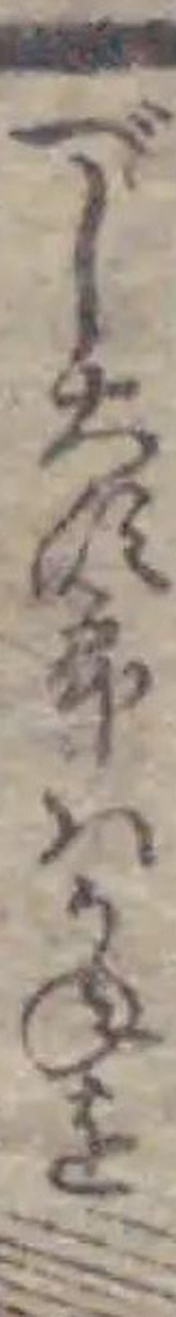べし大次郎はかねを
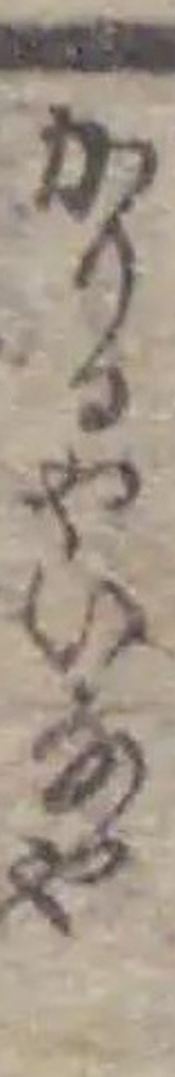かりるやいなや
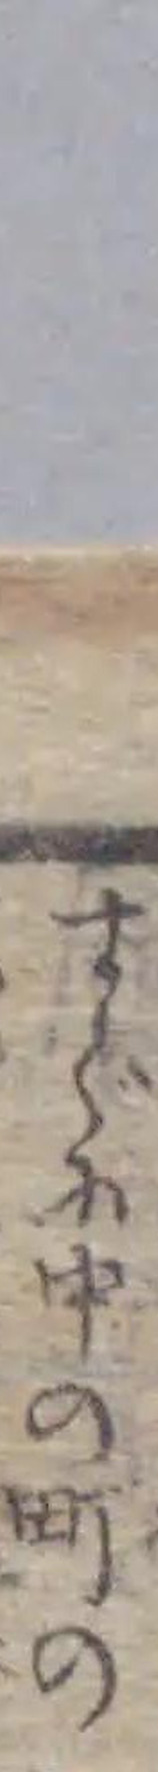すぐに中の町の
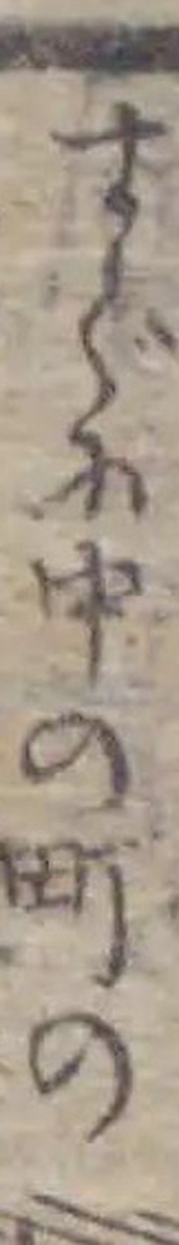すぐに中の町の
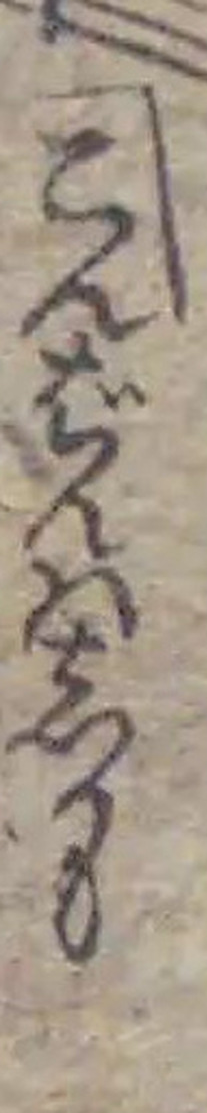〽こんばんはしかも
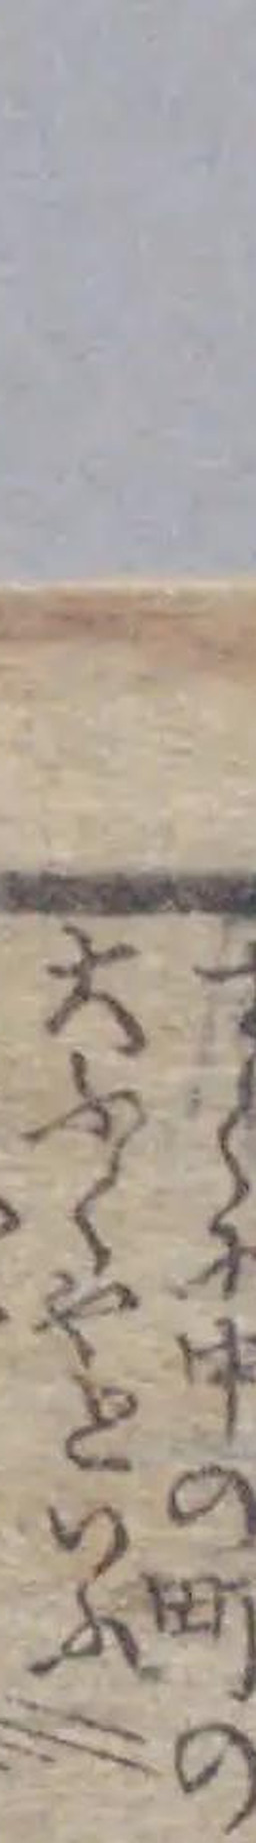代ふくやといふ
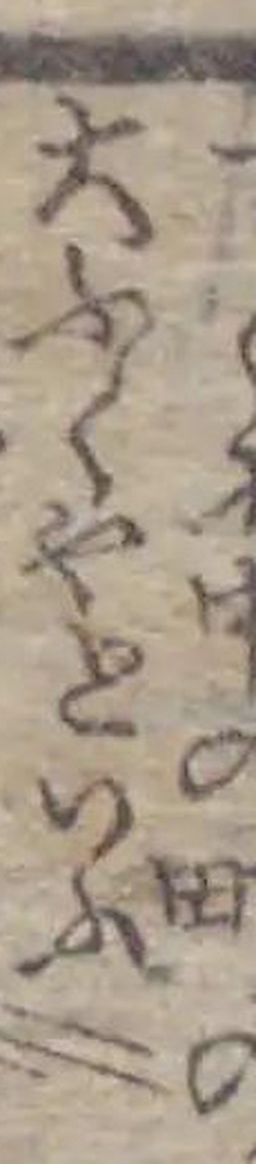代ふくやといふ
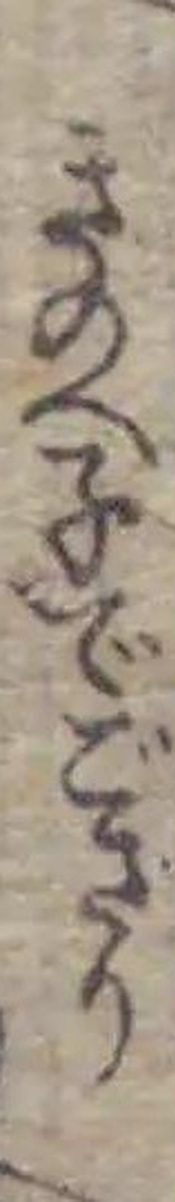きのへ子でござり
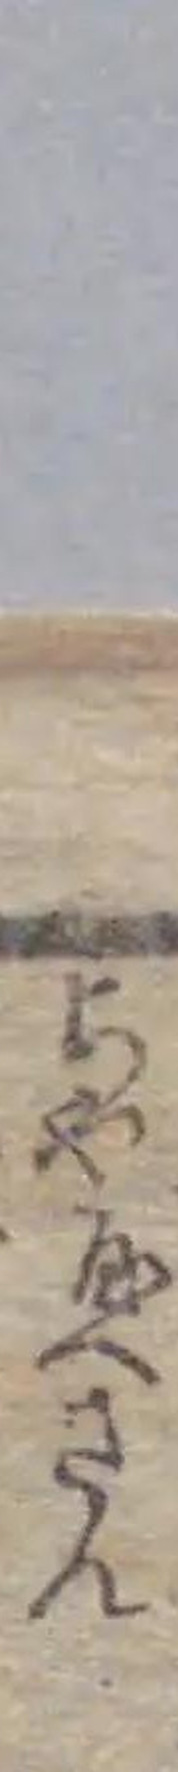ちや屋へさん
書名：福壽海旡量品玉 3巻
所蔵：国立国会図書館 National Diet Library, JAPAN
